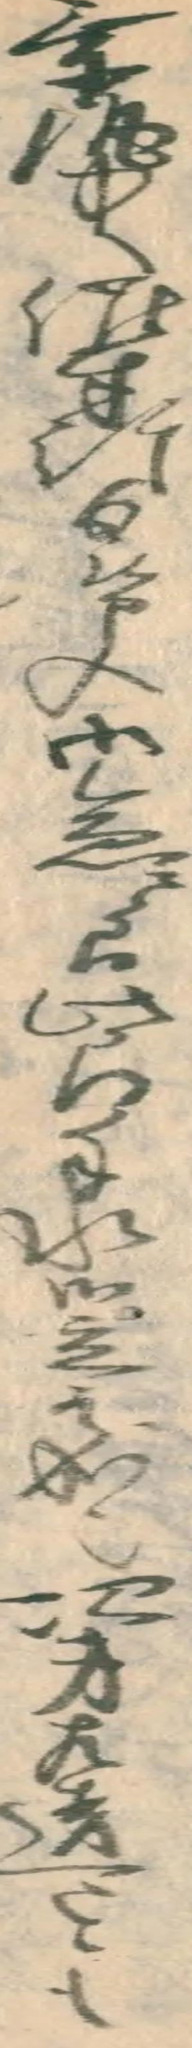乗尻中へ催奉行ゟ被申入御急ニ候間此間手水御立可被成也次第相違候とも
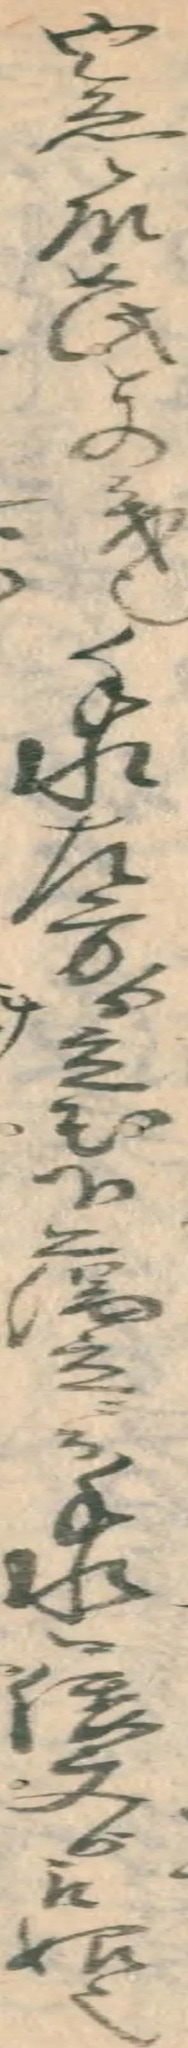御急候故如此との義也手水左方ゟ立尤下臈立ニ而手水ハ倭文ゟ被始也
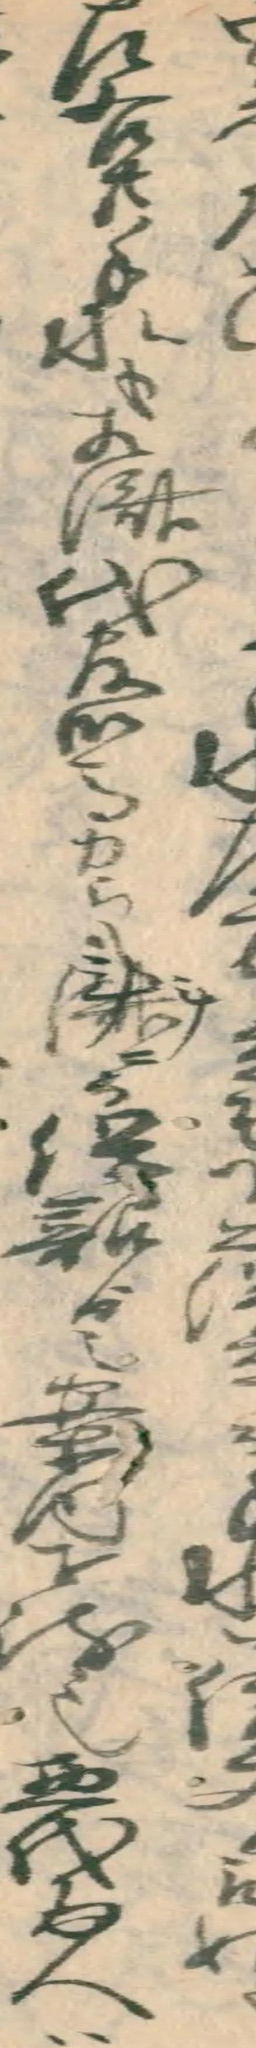左右共手水も相済代官御馬カら計ニ而保韶ゟ之案内を待也惣代両人ハ
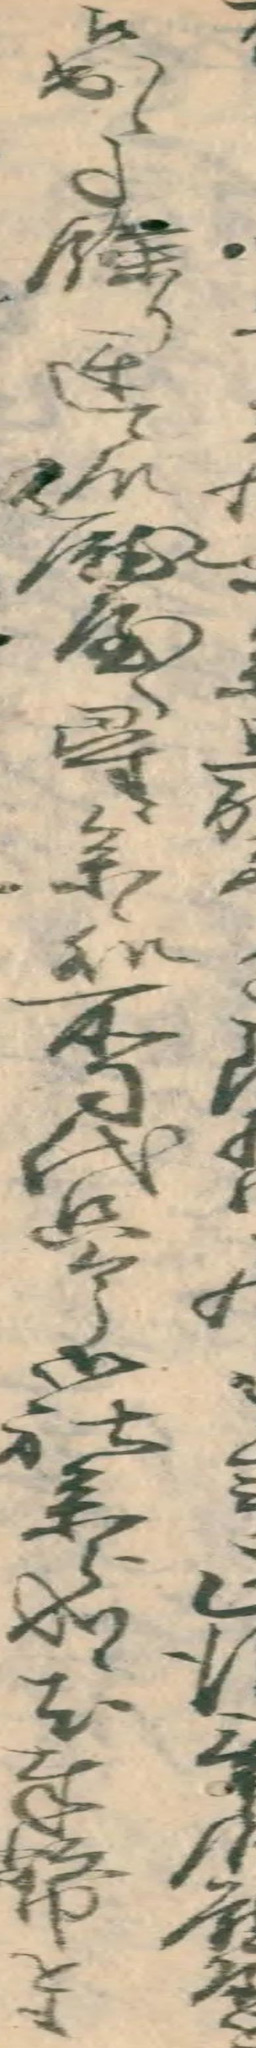被出候事余り遅候故庁屋へ尋ニ参候処所司代只今御社参被成候尤奉幣をも
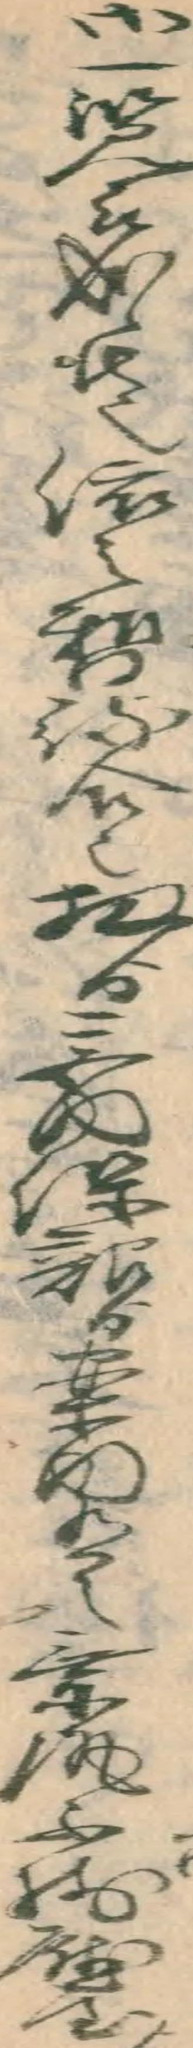御一覧被成候由也依之暫待合也扨ゟ宮内保韶ゟ案内有之乗尻不残庁屋ゟ
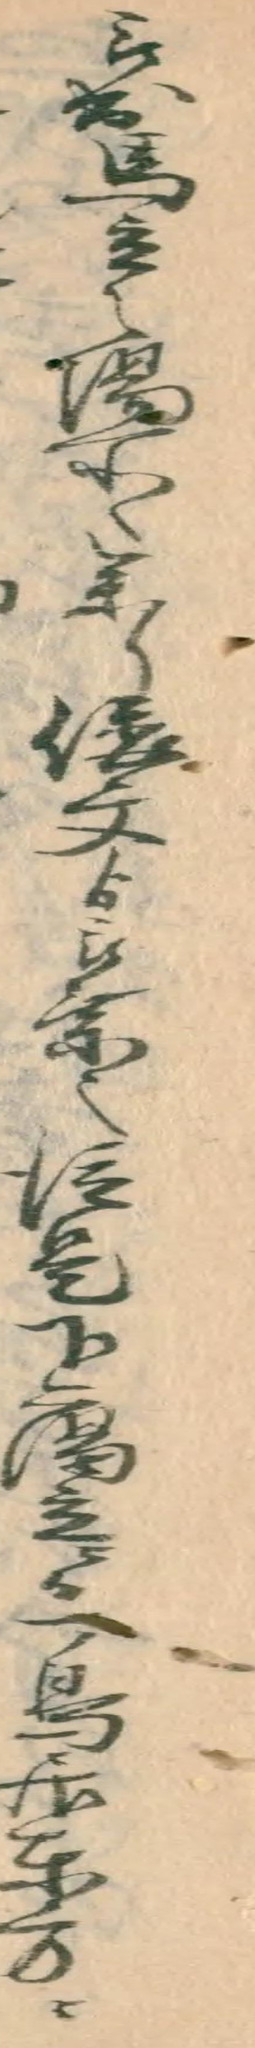被出馬立之場所へ参り倭文ゟ被乗之従是下臈立ニ而一ノ鳥居東方ニ
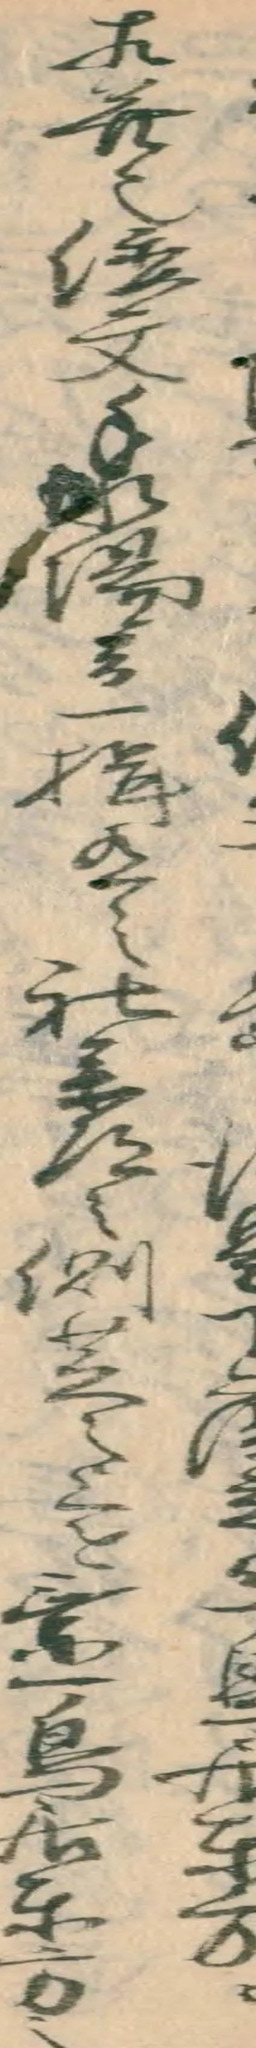相并也倭文手水場ニ而一揖有之社参道之側芝之上を乗一ノ鳥居東方へ
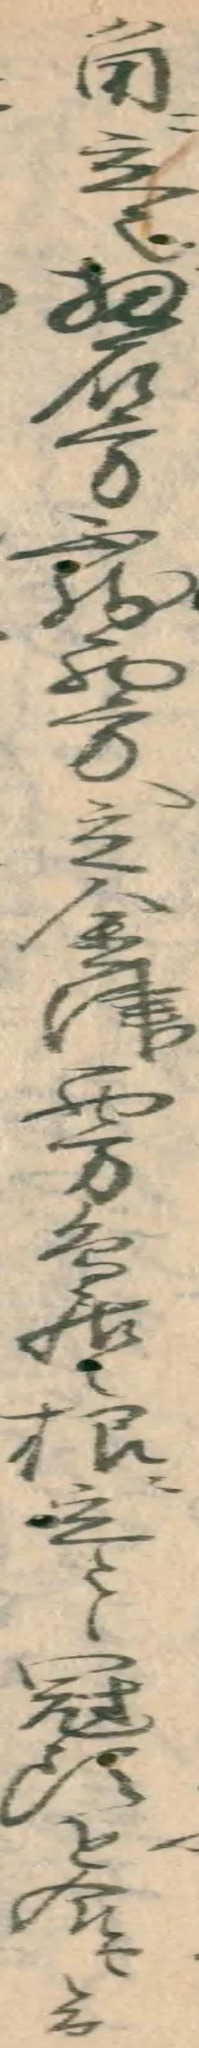角ニ立也扨右方不残西方へ立金津西方鳥居之根ニ立候て冠頭を合セ候而
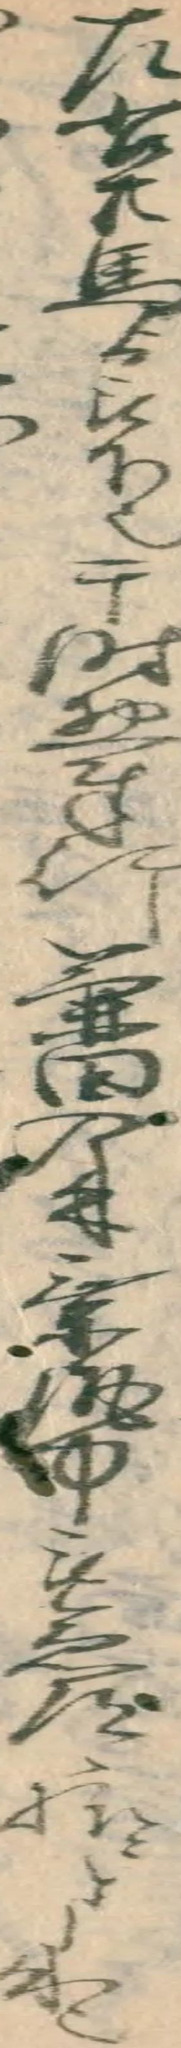左右共馬ゟ被下也于時惣奉行兼田入来乗尻中被急道候様ニと申来也
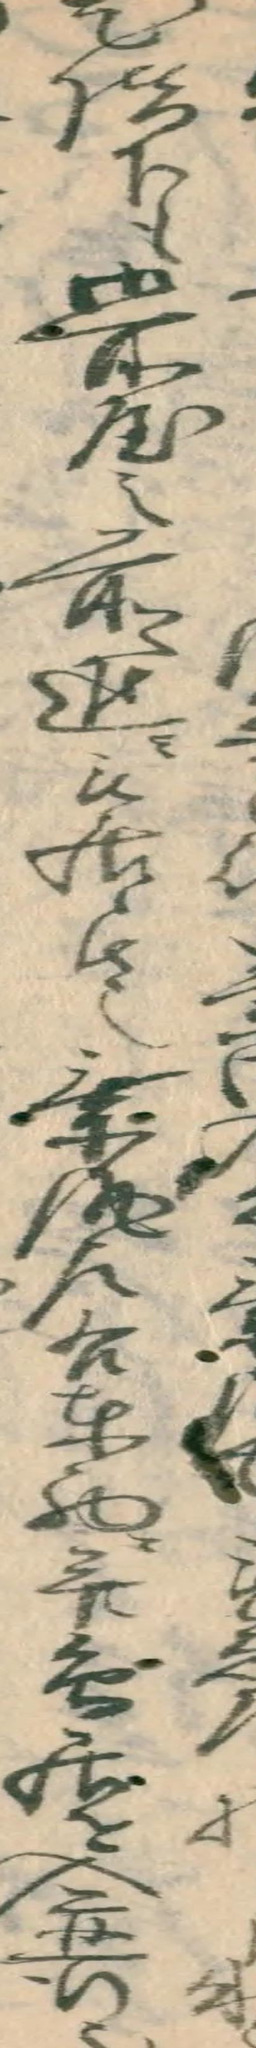尤階下も御所屋之前へ進ミ被居候由也乗尻左右東西ニ并鳥居を入並行也
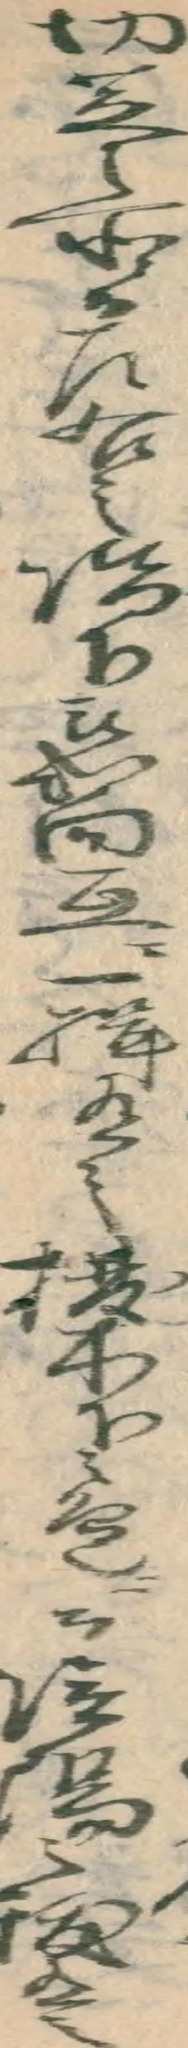切芝之所ニ而左右之階下被出向互ニ一揖有之榎木下之辺ニ而陰陽之祓有之
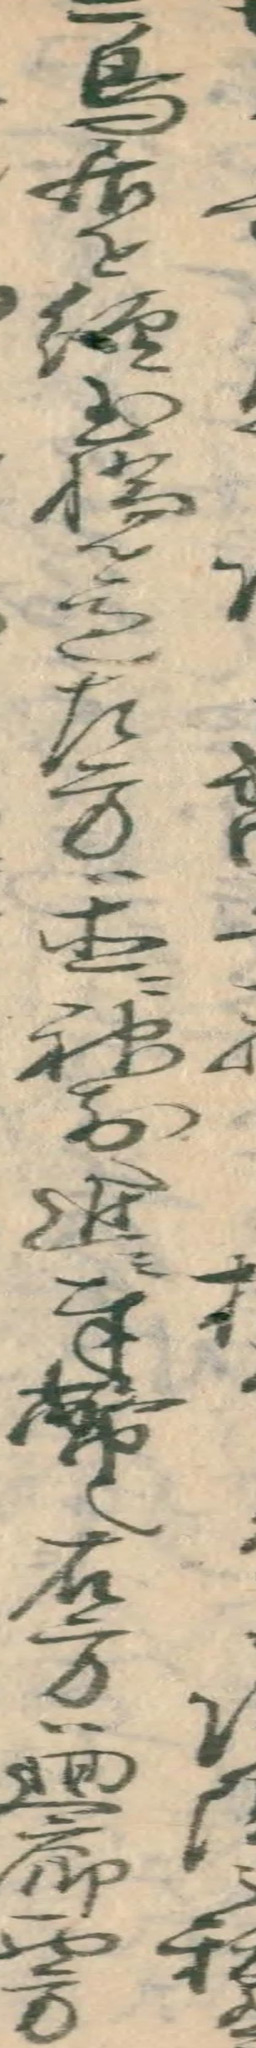二ノ鳥居を経玉橋を過左方ハ直ニ神前へ進ミ奉幣也右方ハ廻廊西方ニ
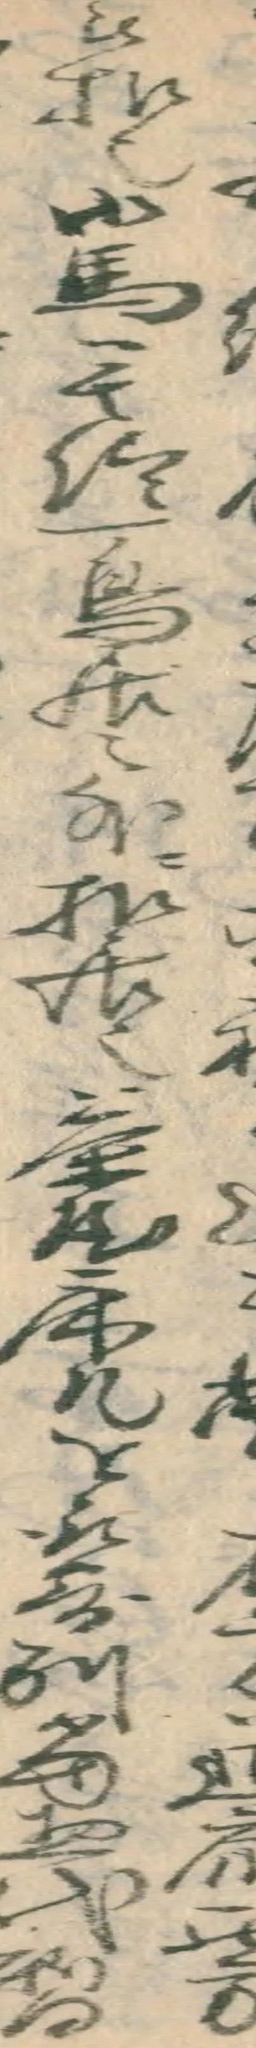被扣也御馬ハ其儘一ノ鳥居之外ニ扣居也茶屋床几を取寄別当惣代暫
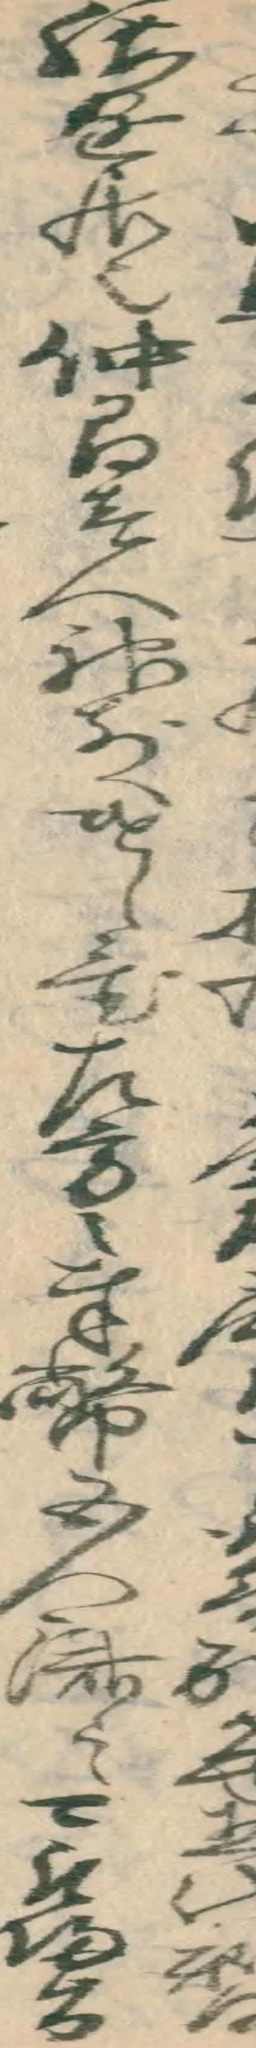腰懸居也仲間壱人神前へ遣し置左方之奉幣五人済候ハヽ可罷被帰旨
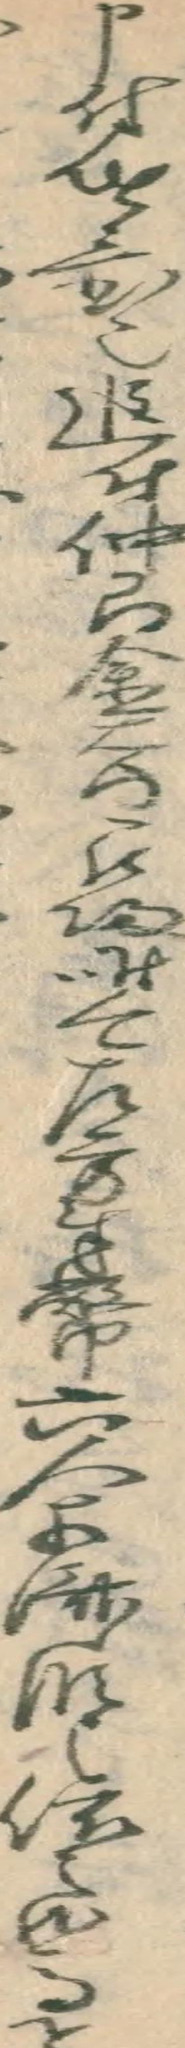申付遣置也追付仲間金右衛門罷帰唯今左方奉幣六人相済候段申候依之御馬を
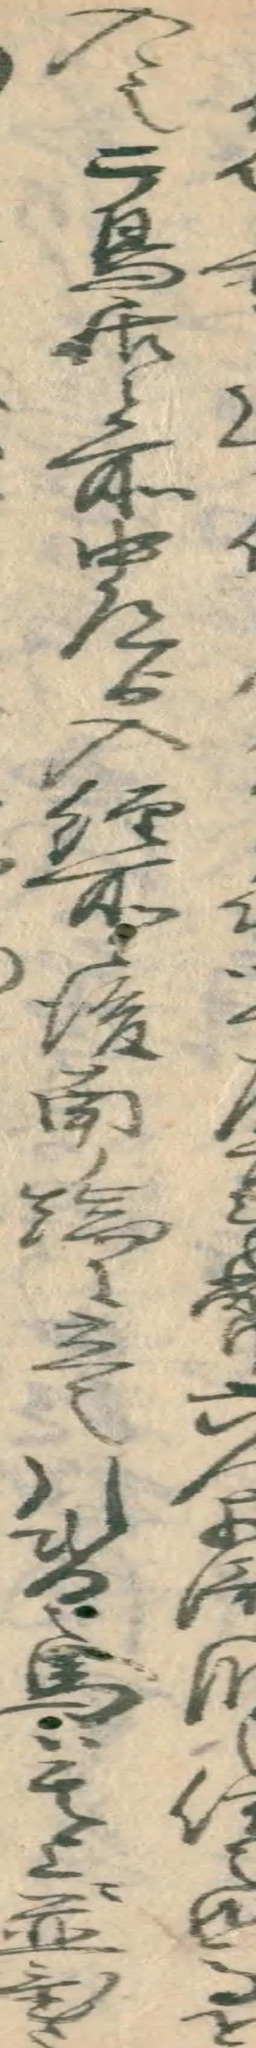入候也二ノ鳥居之前中道ゟ入経所之後南ノ端ニ立也引替之馬ハ其上ニ並置也
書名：賀茂社記録. 第58冊
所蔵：国立国会図書館 National Diet Library, JAPAN
